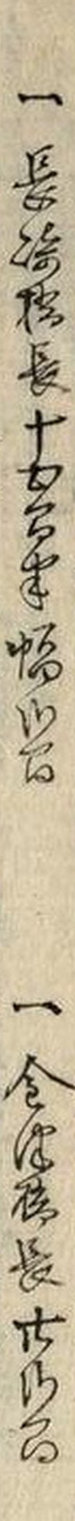一長崎橋長十五間半幅弐間一金津橋長廿弐間
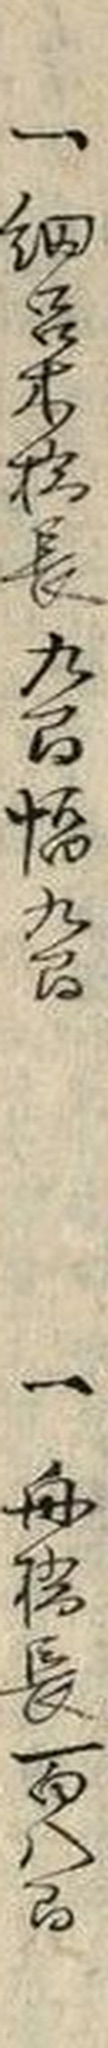一細呂木橋長九間幅九間一舟橋長百八間
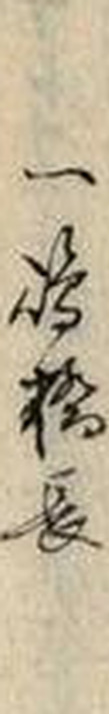一嶋橋長
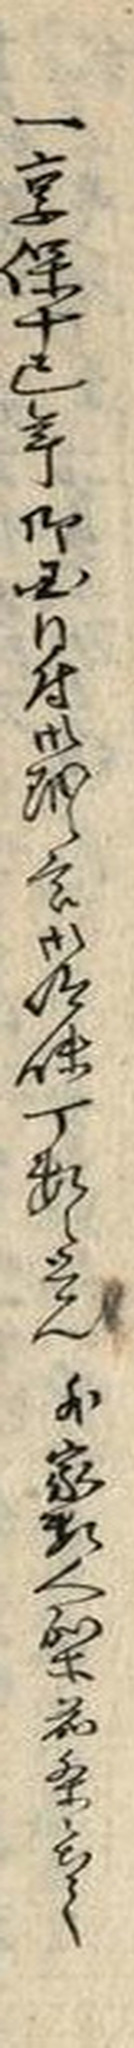一享保十巳年御国目付御越候節御吟味丁数之覚外家数人別等前条ニ出之
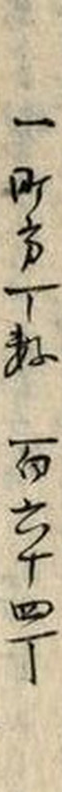一町方丁数百六十四丁
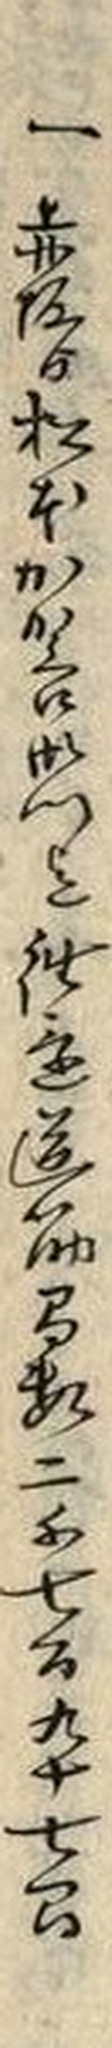一赤坂ゟ松本加賀口御門迄往還道筋間数二千七百九十七間

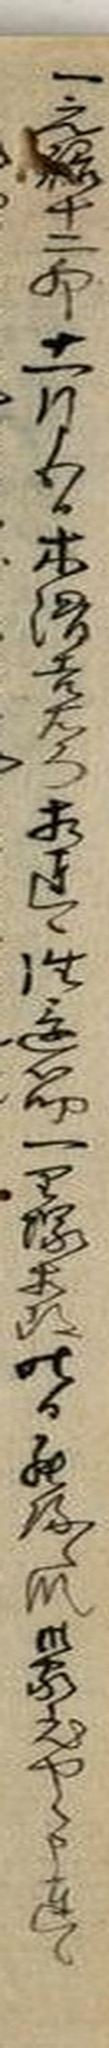一元禄十二卯十一月五日木滑吉左衛門相達候往還筋一里塚相改昨日罷帰候段御家老中へ申達候
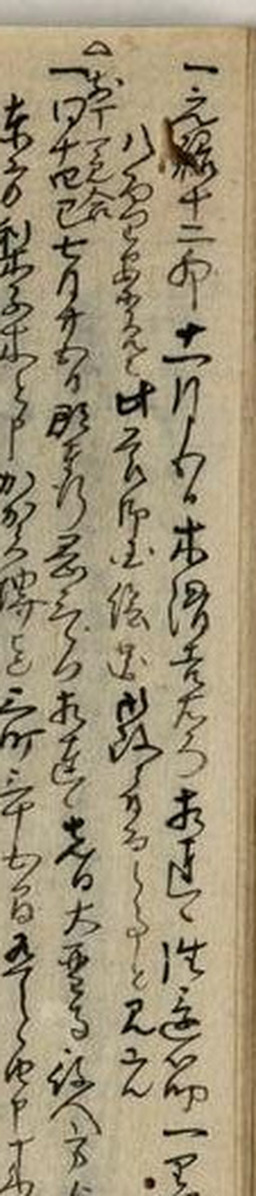八百里案スルニ此節御国絵図御改ニ付而之事と見ユル
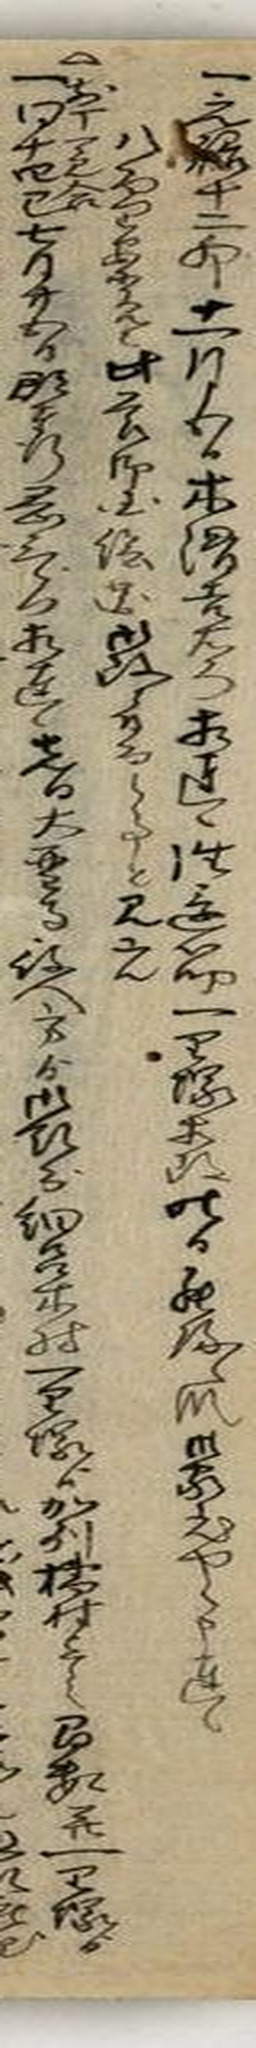一同十四巳七月廿五日郡奉行岡三郎右衛門相達候先日大聖寺役人方ゟ御領分細呂木村一里塚ゟ加州橘村迄之間数幷一里塚ゟ
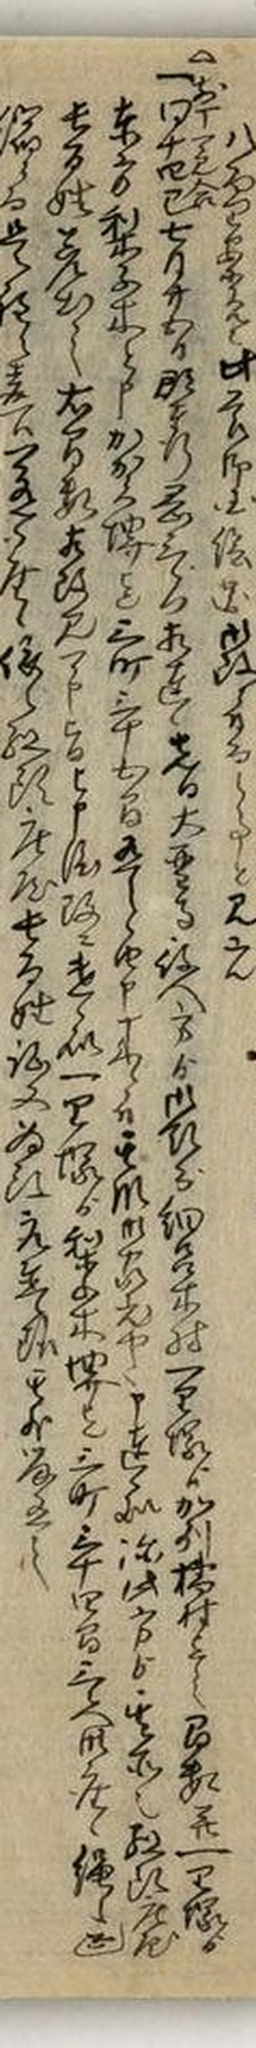東方梨子木と申加賀堺迄三町三十五間有之候由申来候ニ付其段御家老中へ申達候処弥此方ゟ其所之組頭庄屋
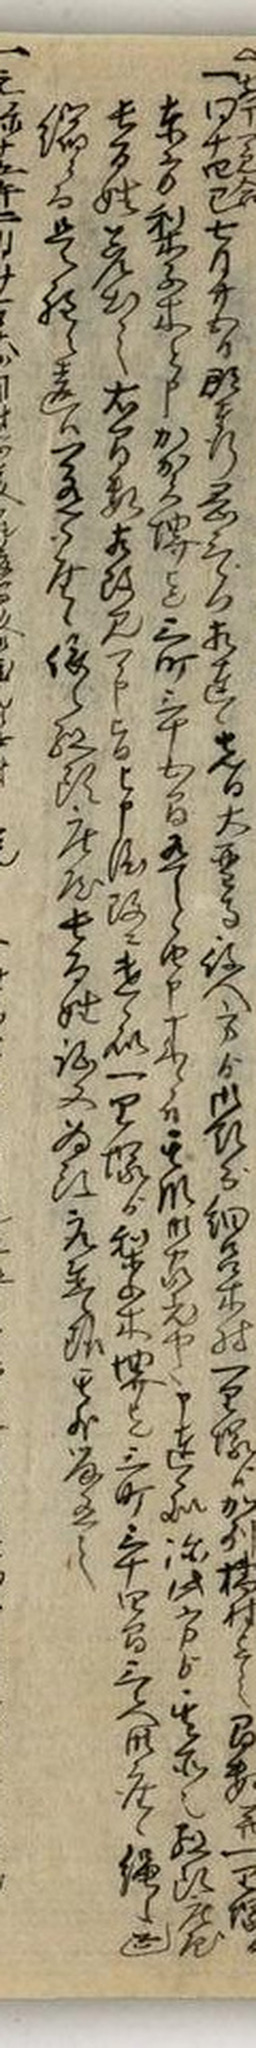長百姓差出之右間数相改見可申旨被申渡改ニ遣候処一里塚ゟ梨子木堺迄三町三十四間三尺御座候縄之延
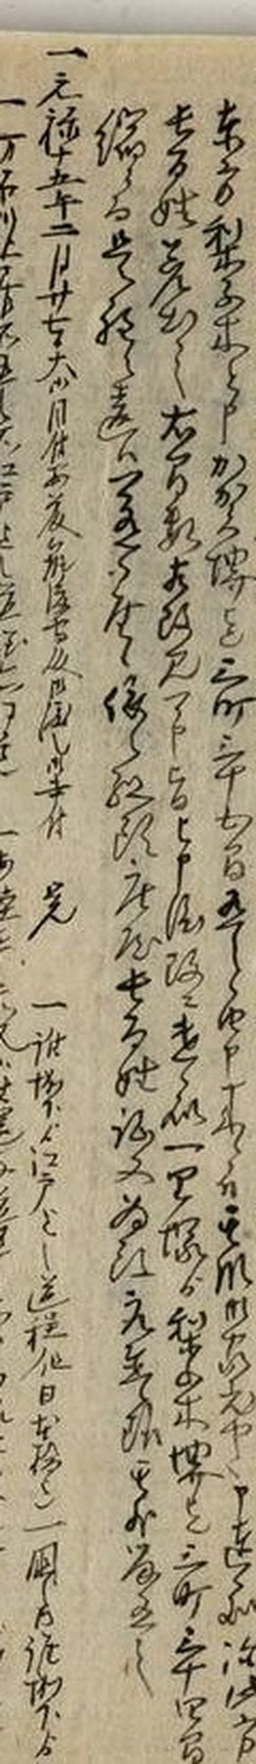縮ニ而是程之違ハ可有御座候依之組頭庄屋長百姓証文為改取置候趣其外留有之
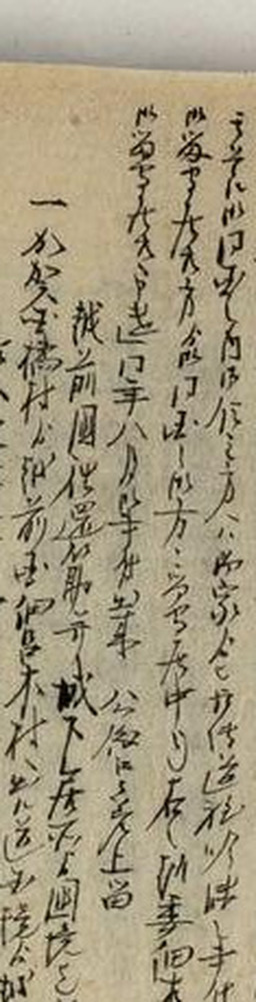御留守居共へ申遣」同年八月御書付出来公儀江差上留
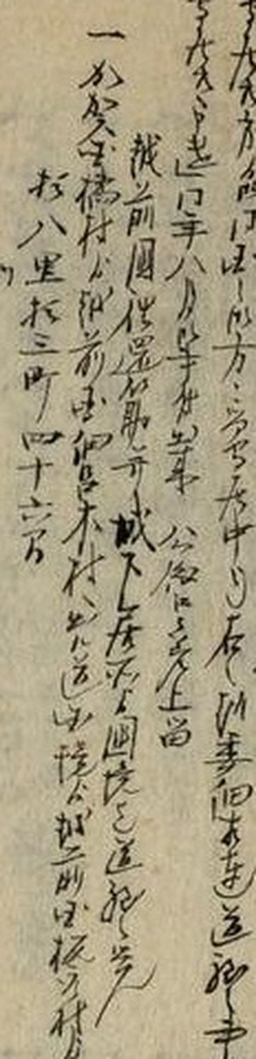越前国往還筋幷城下居所ゟ国境迄道程之覚
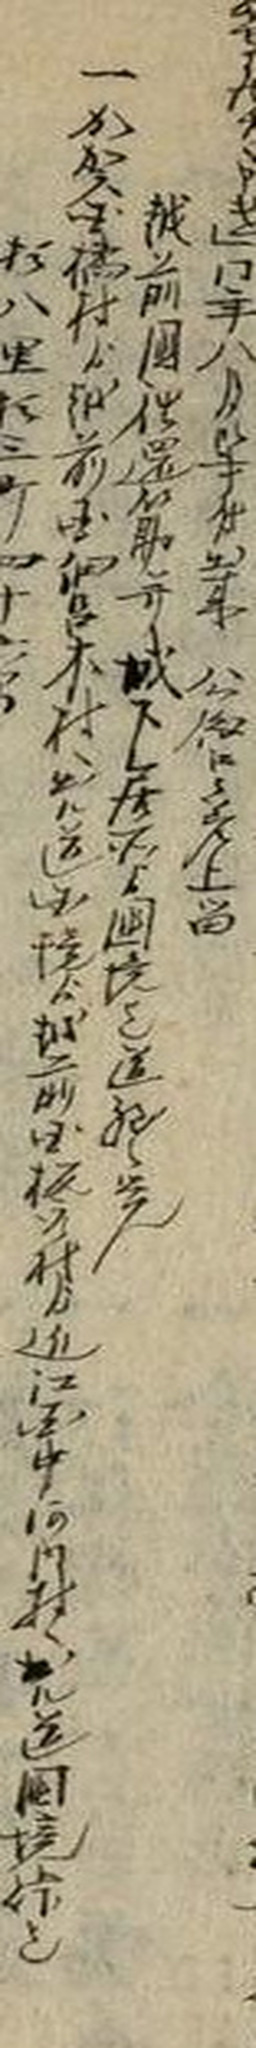一加賀国橘村ゟ越前国細呂木村へ出ル道国境ゟ越前国板取村ゟ近江国仲河内村へ出ル道国境峠迄
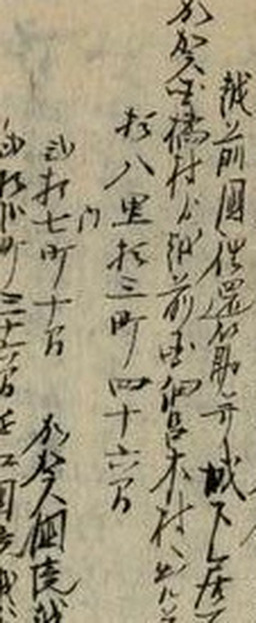拾八里拾三町四十六間
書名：御国他国諸事之部
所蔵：福井県文書館 Fukui Prefectural Archives
